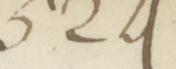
524
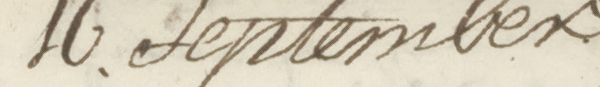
16.September
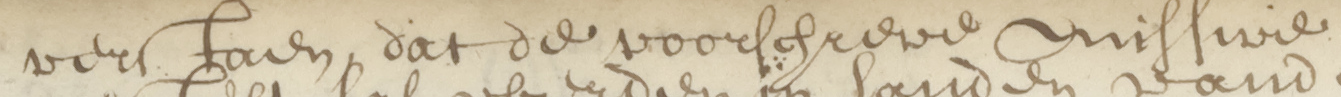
verstaen, dat de voorschreve missive
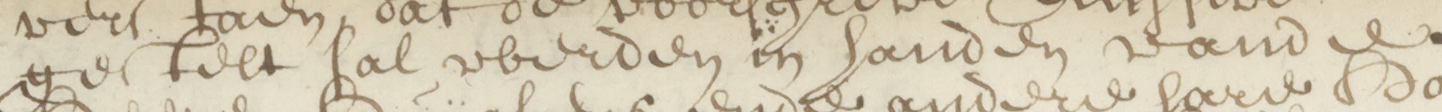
gestelt sal werden in handen vande
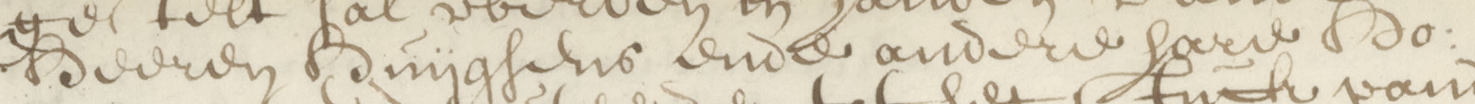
Heeren Huijghens ende andere hare Ho:
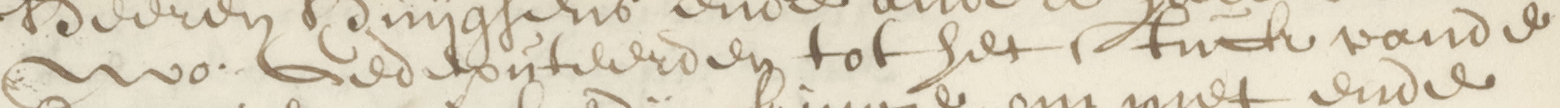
Mo: Gedeputeerden tot het stuck vande
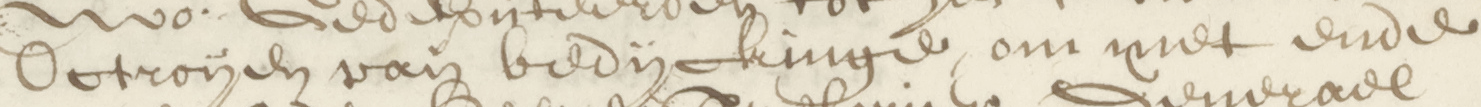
Octroijen van bedijckinge, om met ende
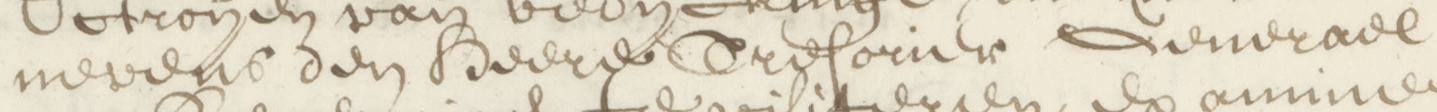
nevens den Heere Tresorier Generael
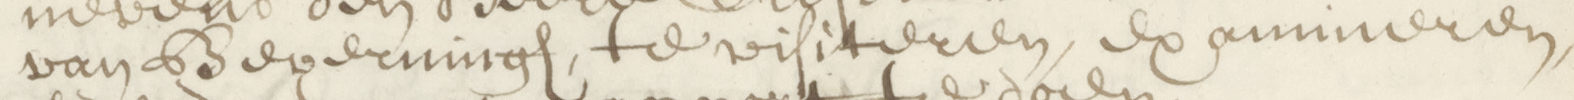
van Beverningh, te visiteren, examineren,
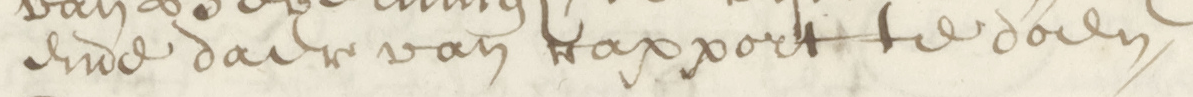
ende daer van rapport te doen.
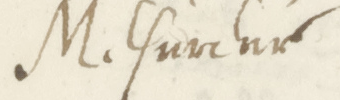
Mesureur
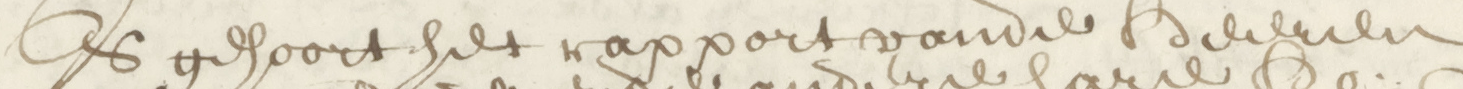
Is gehoort het rapport vande Heeren
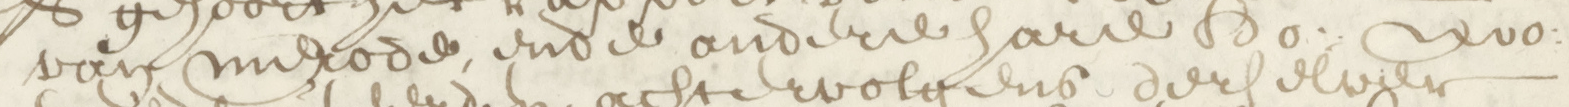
van merode, ende andere hare Ho:Mo:
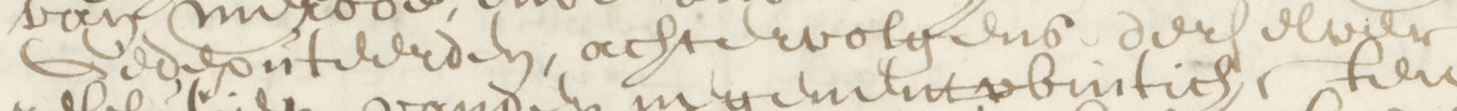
Gedeputeerden, achtervolgens derselver
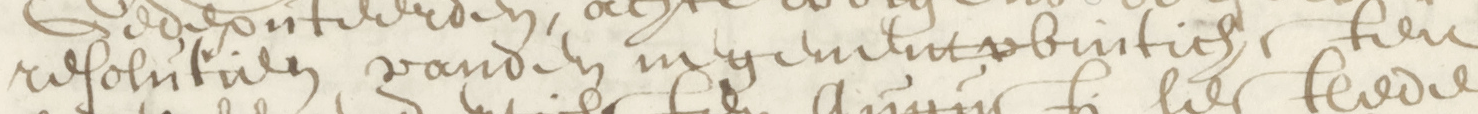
resolutien vanden negenentwintichsten
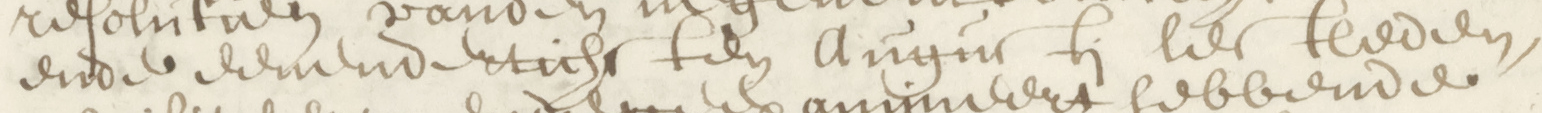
ende eenendertichsten Augusti lestleden,
